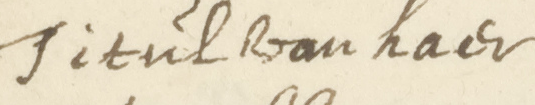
Titul van haer
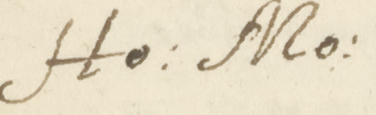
Ho:Mo:
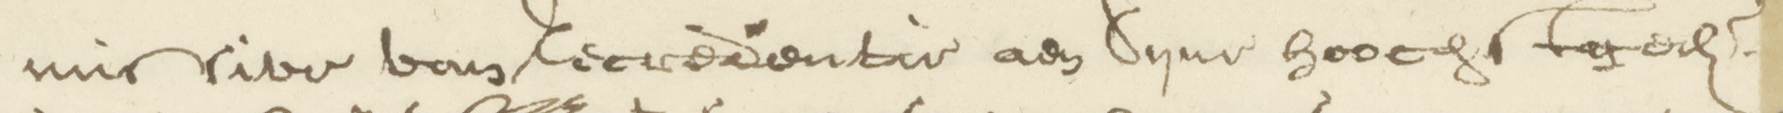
missive van recredentie aen Syne hoochstgede.
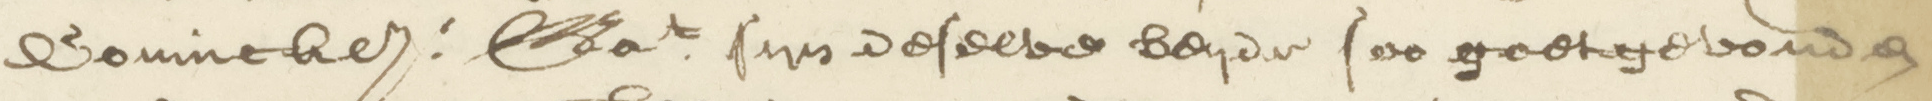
Coninckl. Mat. syn deselve beyde soo goetgevonden
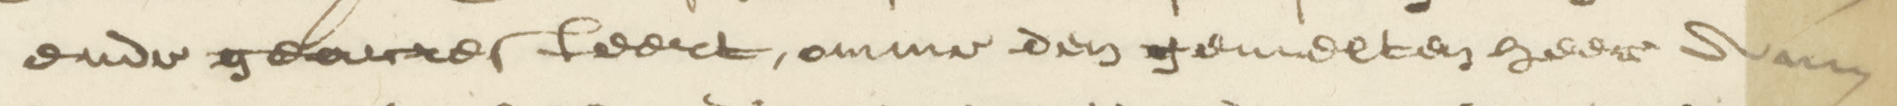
ende gearresteert, omme den gemelten heer Am„
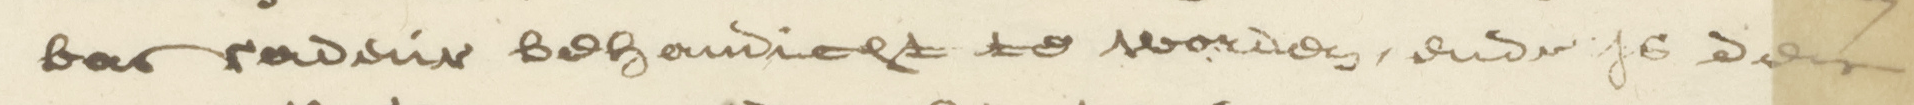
bassadeur behandicht te worden, ende Is den
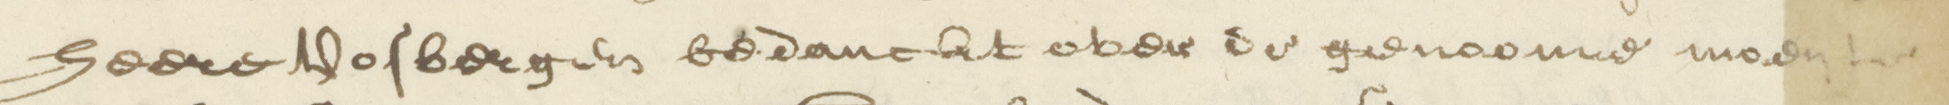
Heere Vosbergen bedanckt over de genoome moeyte
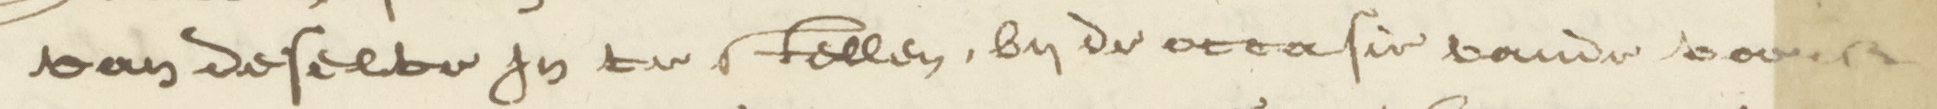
van deselve In te stellen, by de occasie vande voors
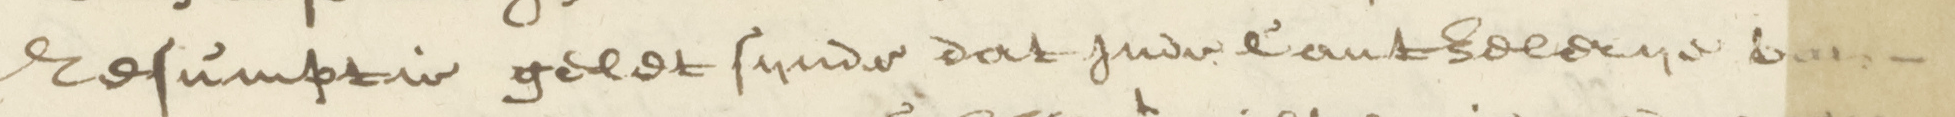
resumptie gelet synde dat Inde cantzelerye van -
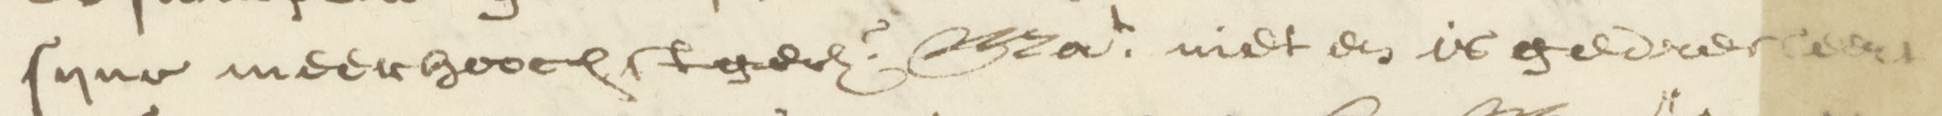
syne meerhoochstgede. Mat. niet en is gedresseert
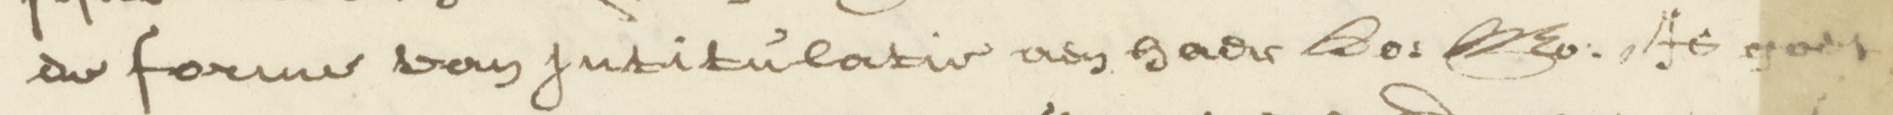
de forme van Intitulatie aen haer Ho:Mo: Is goet
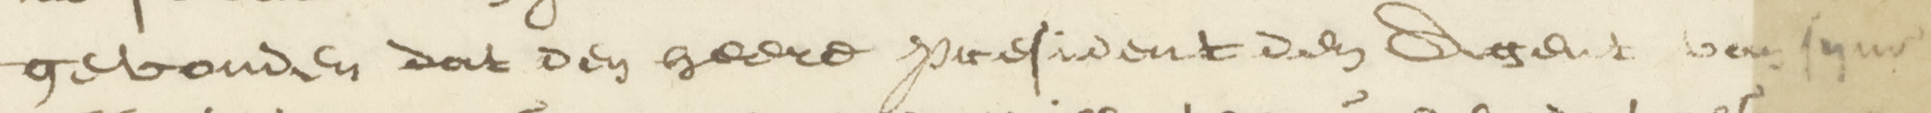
gevonden dat den heere president den Agent van syne
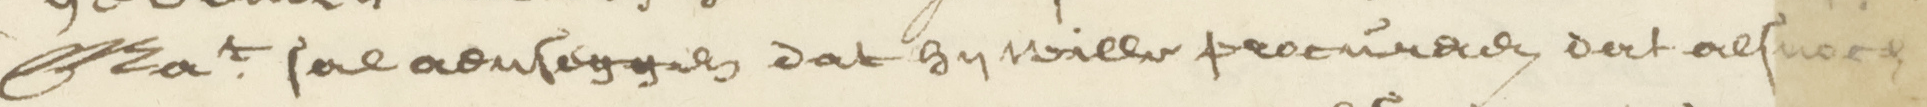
Mat. sal aenseggen dat hij wille procureren dat alsnoch
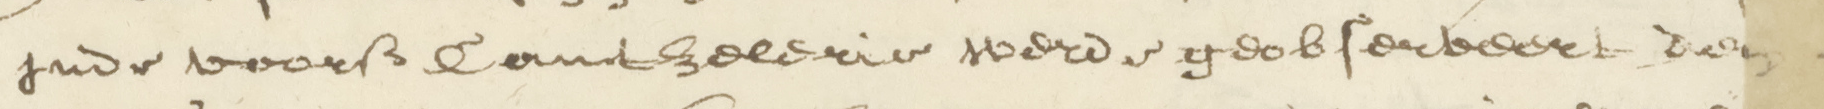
Inde voors cantzelerie werde geobserveert den
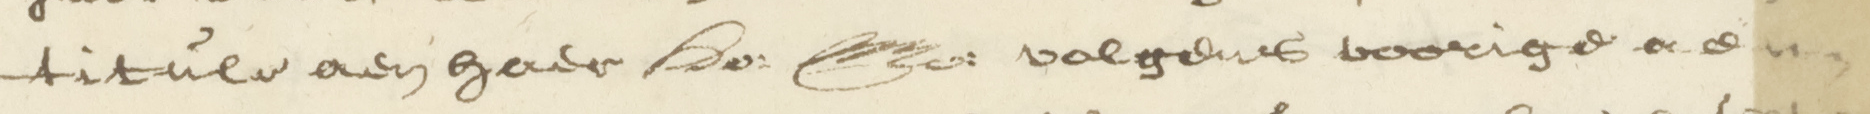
titule aen haer Ho:Mo: volgens voorige aen,,
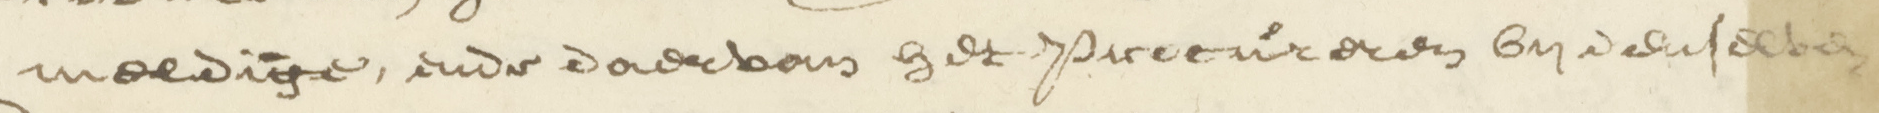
meldige, ende daervan het procureren by denselven
